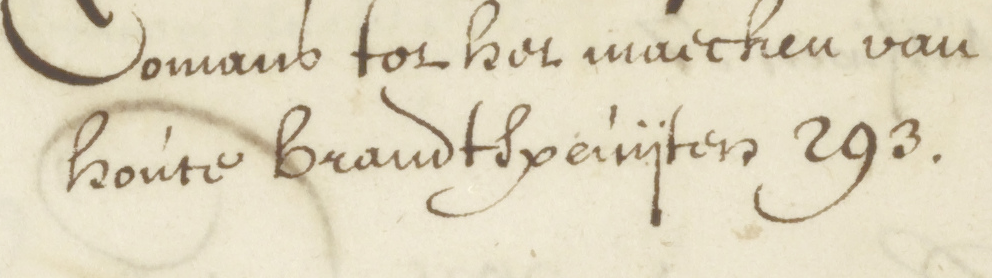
houte brandtspeuijten 293.
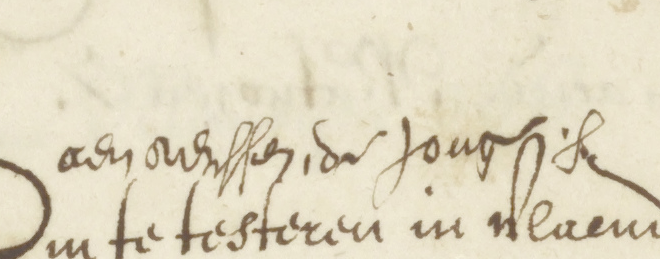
aen aerssen, de jonge
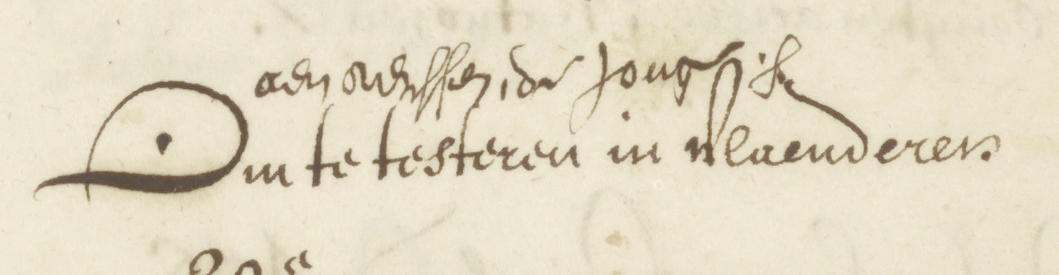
Om te testeren in Vlaenderen,
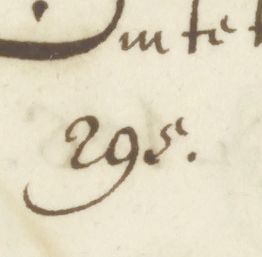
295.
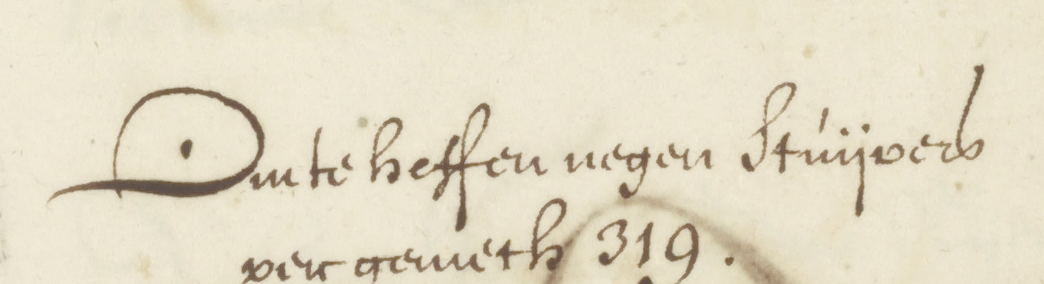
Om te heffen negen Stuijvers
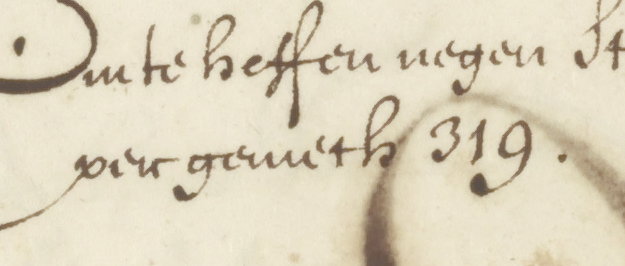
per gemeth 319.
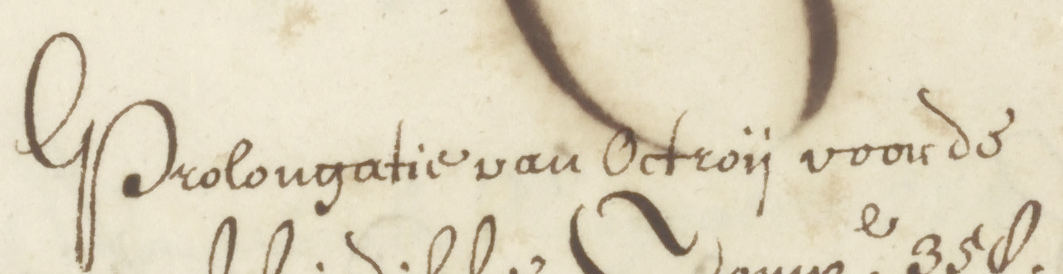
Prolongatie van Octroij voor de
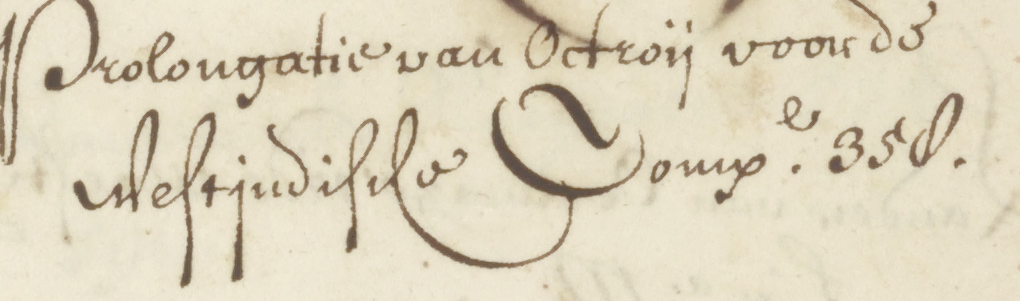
westindische Compe. 358.
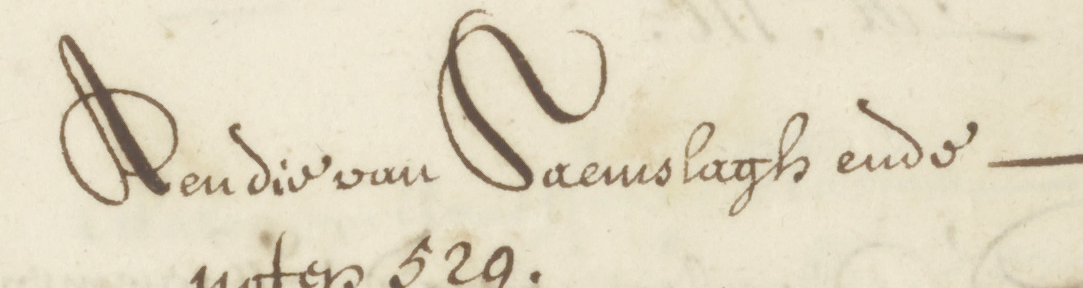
Aen die van Saemslagh ende
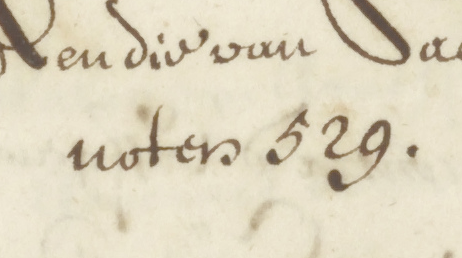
noten 529.
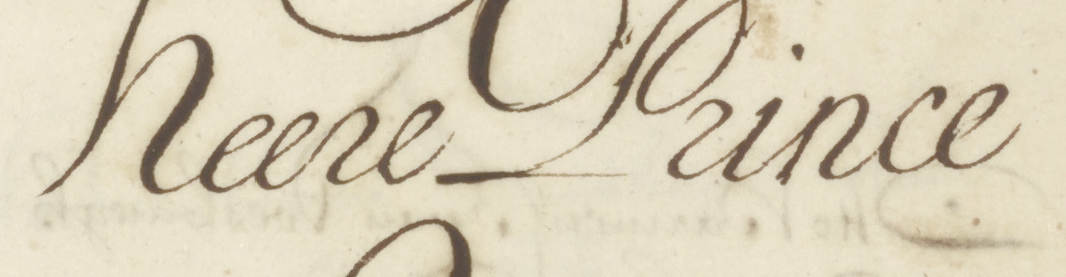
Heere Prince
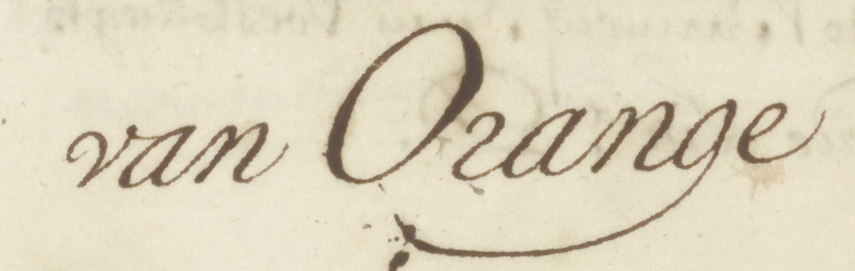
van Orange
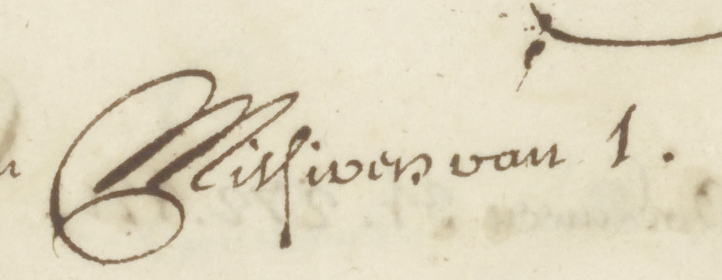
Missiven van 1.
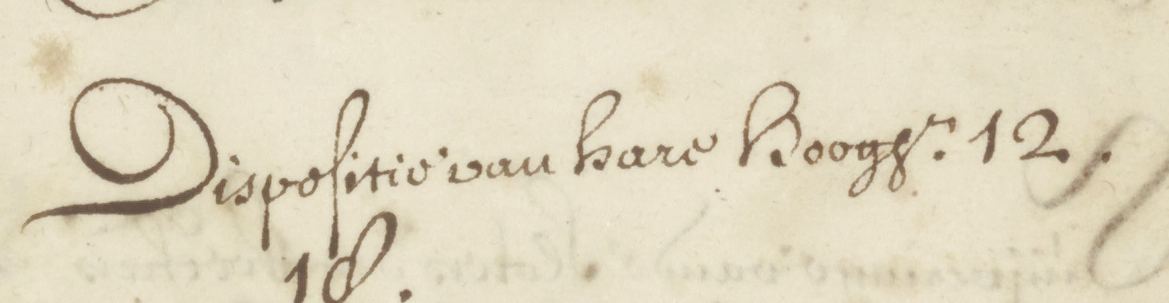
Dispositie van hare Hooght .12,
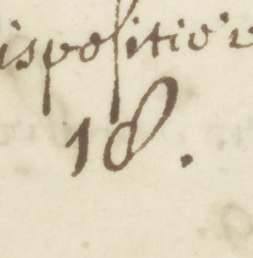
18.
